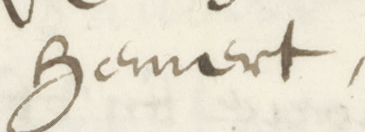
Hemert.
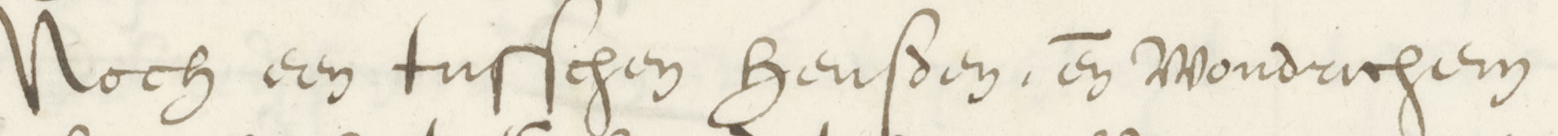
Noch een tusschen Heusden, en Woudrichem
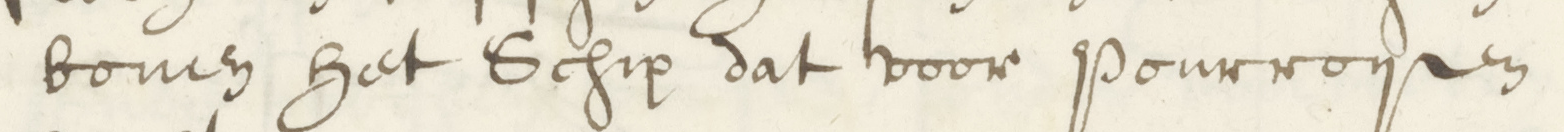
bouen het Schip dat voor Pourroyen
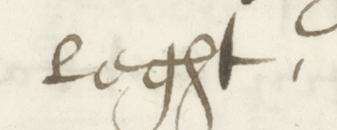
leght.
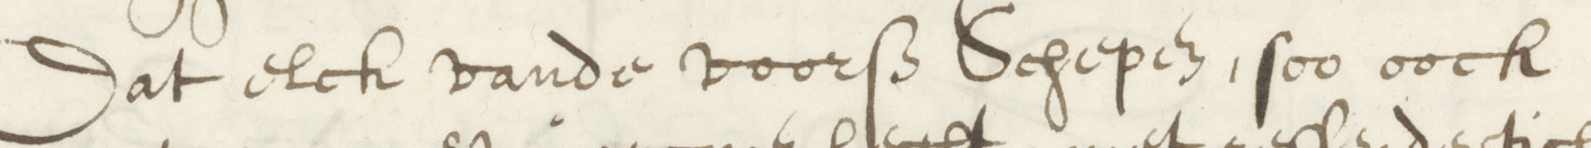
Dat eck vande voors schepen, soo oock
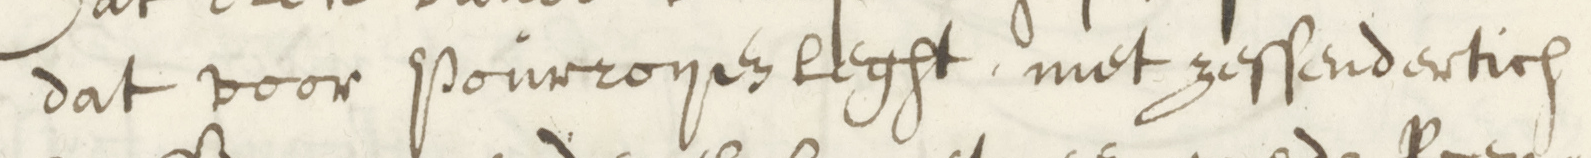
dat voor Pourroyen leght, met zessendertich
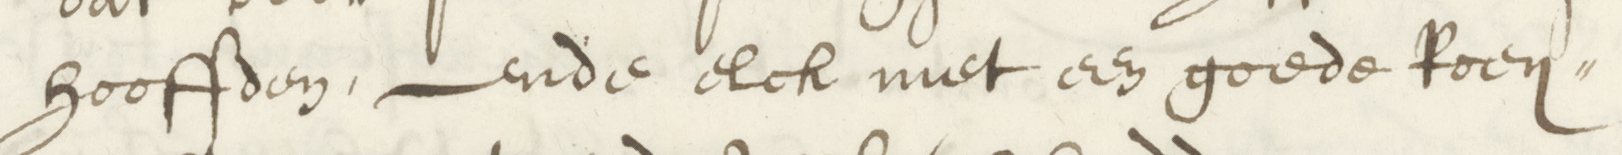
hooffden, ende elck met een goede Roey„
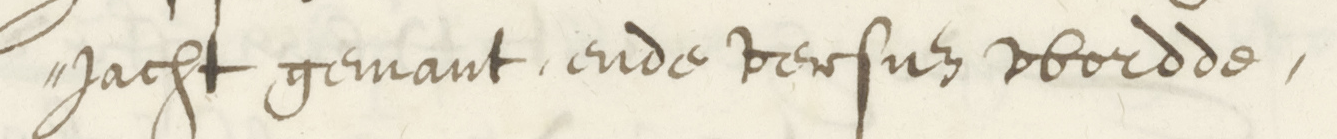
jacht gemant ende versien wordde.
